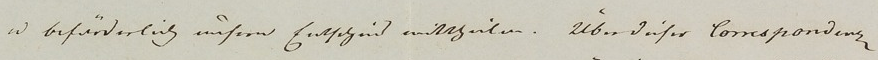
u beförderlich unsern Entscheid mittheilen. Über dieser Correspondenz
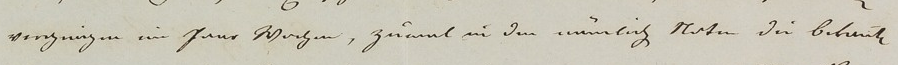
vergingen ein Paar Wochen, zumal in den nämlichen Noten die bekannten
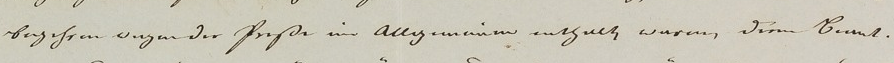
Begehren wegen der Preße im Allgemeinen enthalten waren, deren Beant-
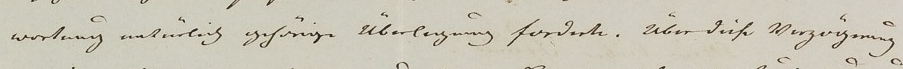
wortung natürlich gehörige Überlegung forderte. Über diese Verzögerung
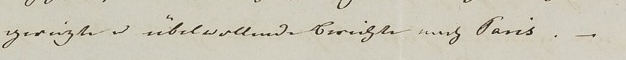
gereizte u übelwollende Berichte nach Paris. –
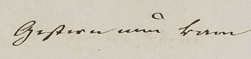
Gestern nun kam
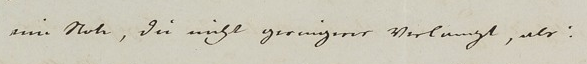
eine Note, die nicht geringeres verlangt, als:
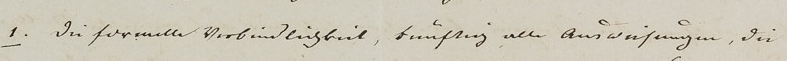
1. Die formelle Verbindlichkeit, künftig alle Ausweisungen, die
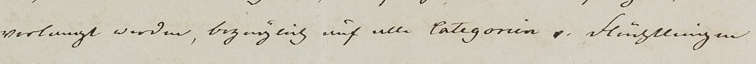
verlangt werden, bezüglich auf alle Categorien v. Flüchtlingen
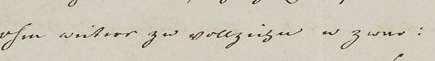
ohne weiters zu vollziehn u zwar:
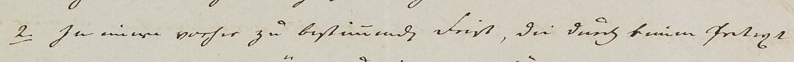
2. In einer vorher zu bestimmenden Frist, die durch keinen Pretext
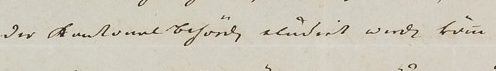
der Kantonal Behörden eludirt werden könne.
